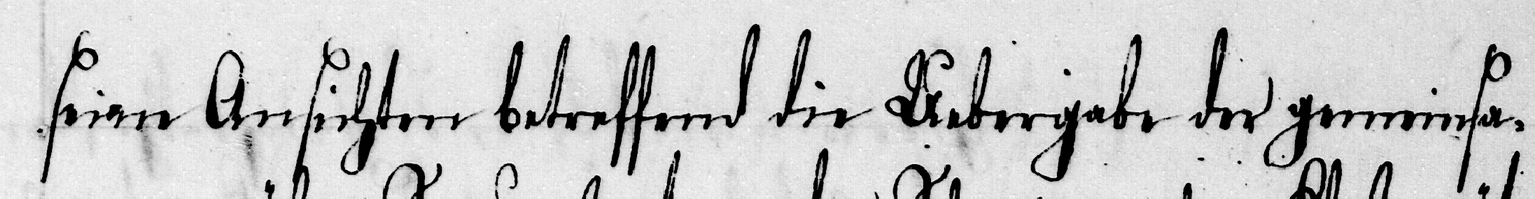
seine Ansichten betreffend die Uebergabe der gemeinsa¬
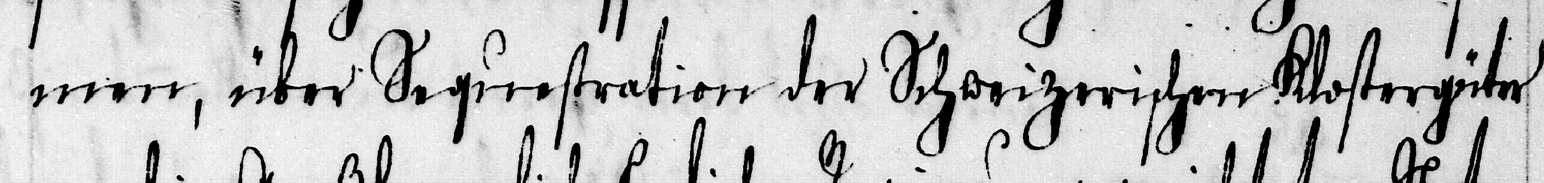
men, über Sequestration der Schweizerischen Klostergüter
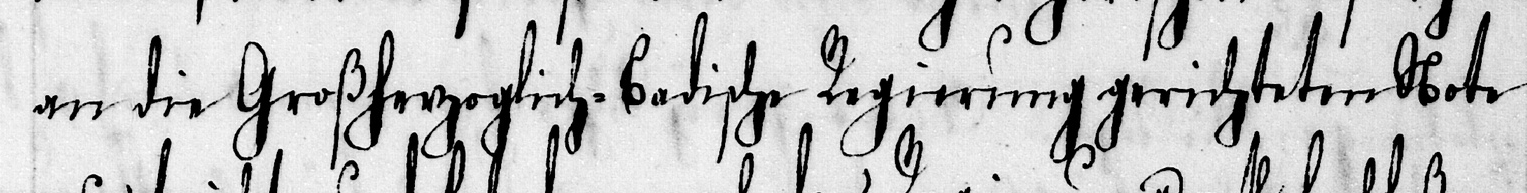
an die Großherzoglich-Badische Regierung gerichteten Note
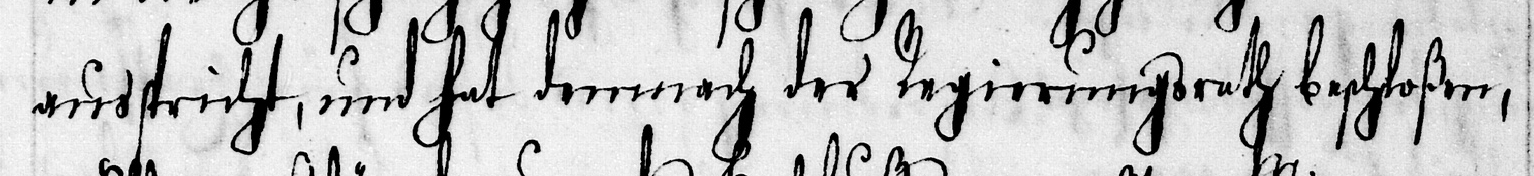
ausspricht, und hat demnach der Regierungsrath beschloßen,
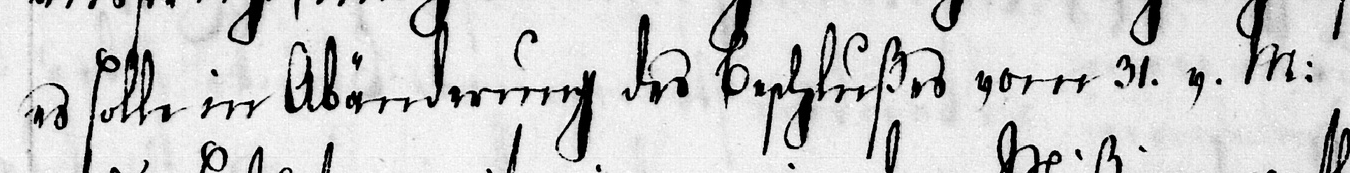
es solle in Abänderung des Beschlußes vom 31. v. M:
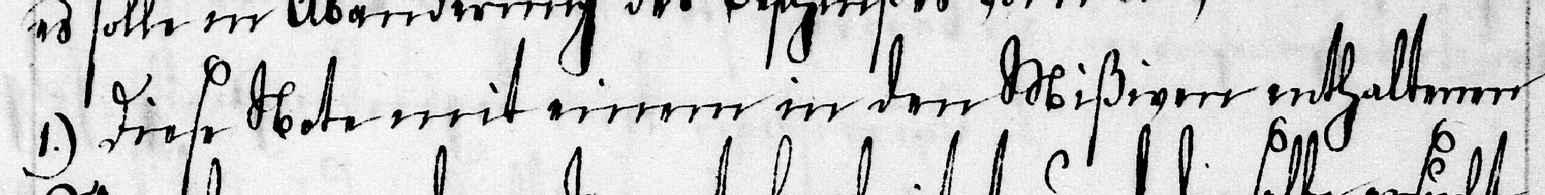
1.) Diese Note mit einem in den Mißiven enthaltenen
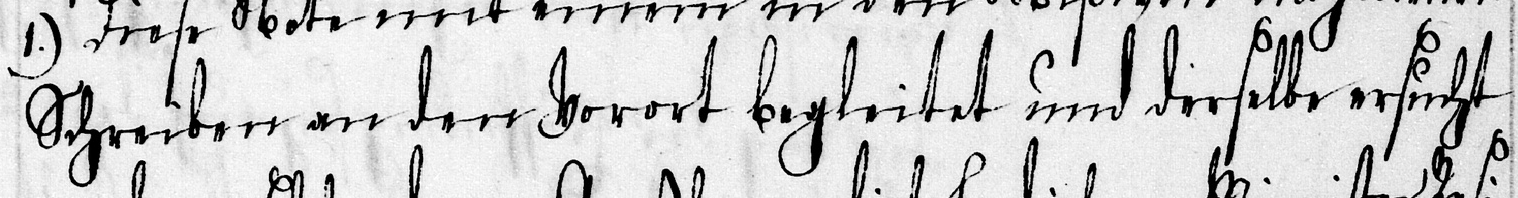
Schreiben an den Vorort begleitet und derselbe ersucht
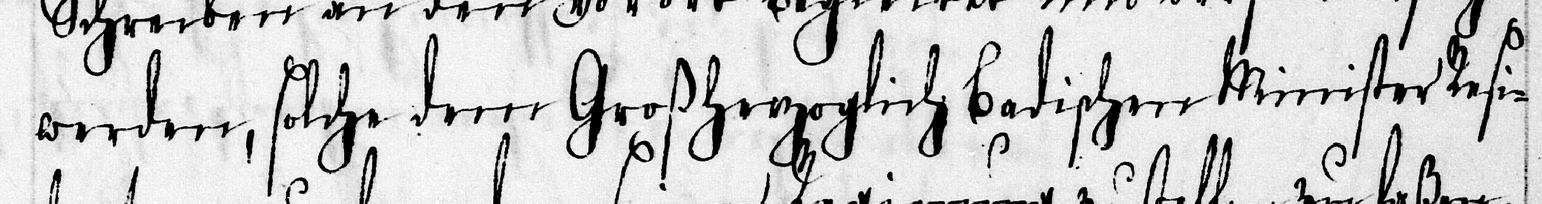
werden, solche dem Großherzoglich Badischen Minister Resi¬
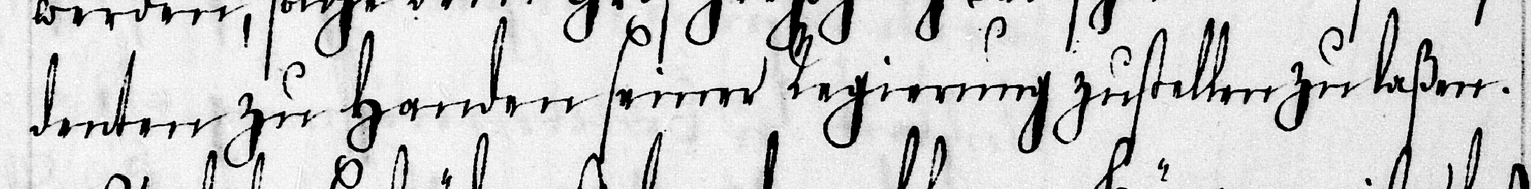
denten zu Handen seiner Regierung zustellen zu laßen.
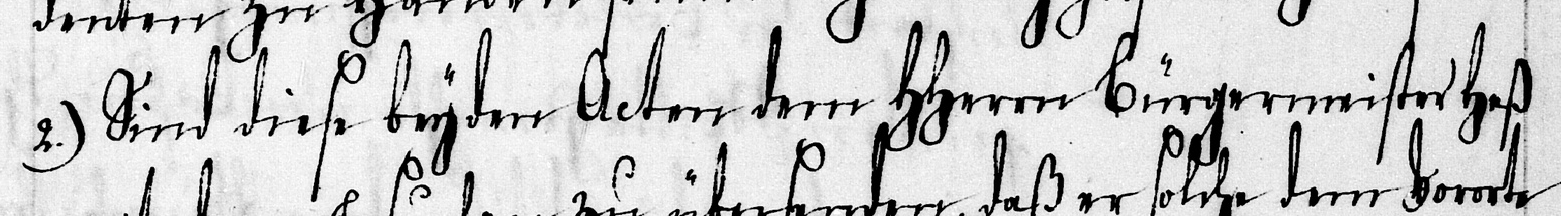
2.) Sind diese beyden Acten dem HHerrn Bürgermeister Heß
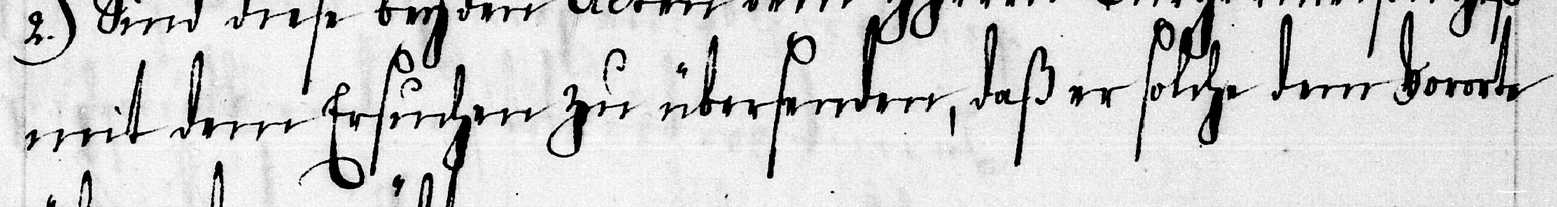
mit dem Ersuchen zu übersenden, daß er solche dem Vororte
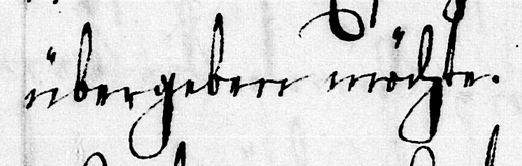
übergeben möchte.
